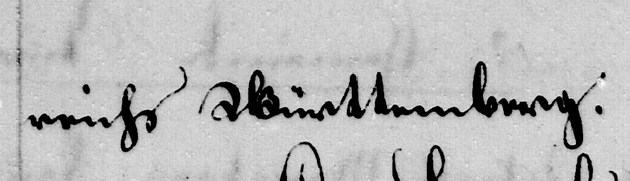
reichs Württemberg.
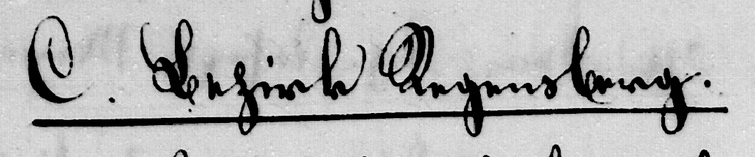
C. Bezirk Regensberg.
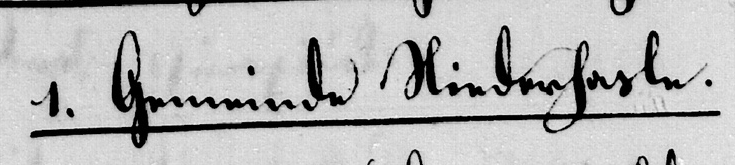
1. Gemeinde Niederhasle.
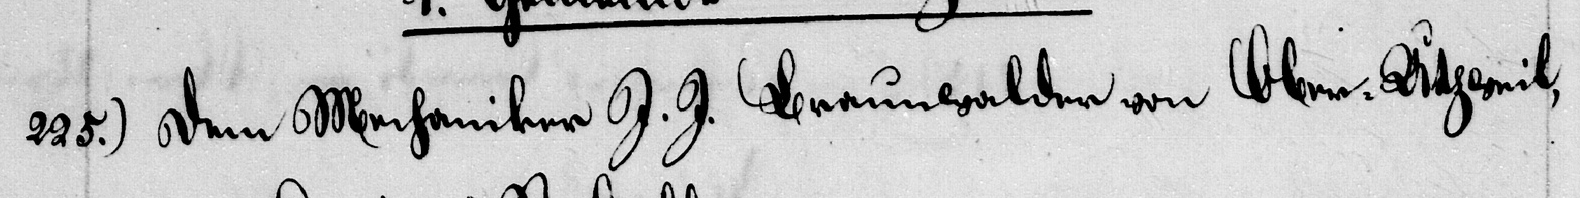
225.) Dem Mechaniker J. J. Braunwalder von Ober-Utzweil,
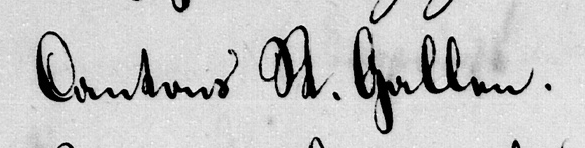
Cantons St. Gallen.
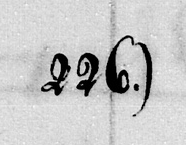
226.)
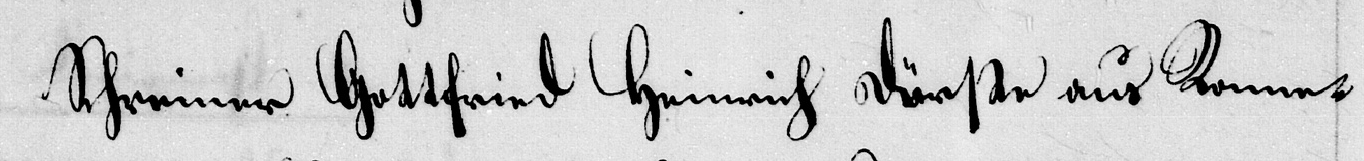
Schreiner Gottfried Heinrich Dörste aus Romm¬
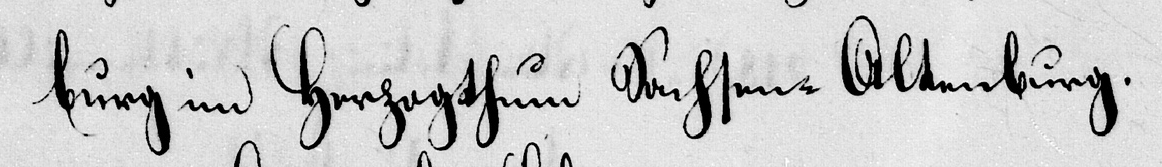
burg im Herzogthum Sachsen-Altenburg.
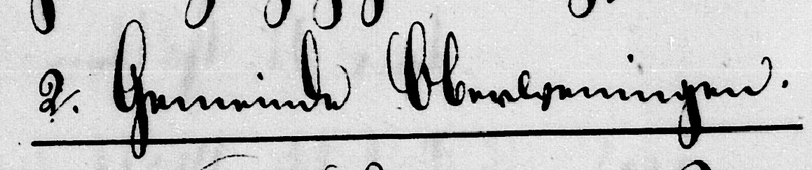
2. Gemeinde Oberweningen.
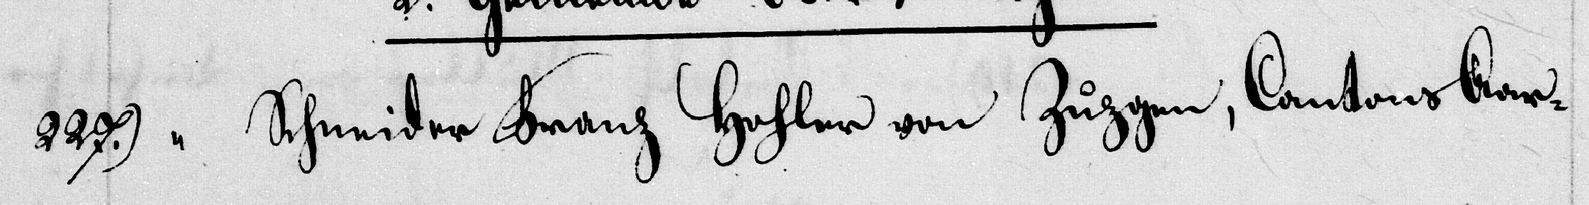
227.) “ Schneider Franz Hohler von Zuzgen, Cantons Aar¬
